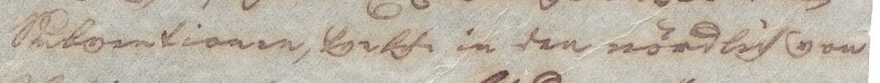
Subventionen, welche in den nördlich von
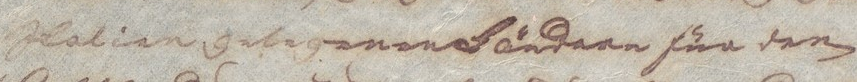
Italien gelegenen Ländern für den
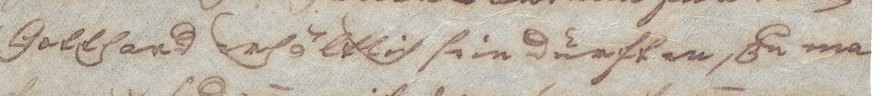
Gotthard erhältlich sein dürften, zu ma-
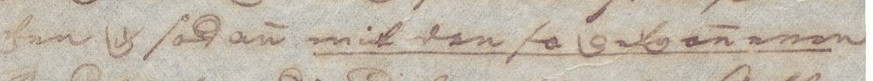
chen & sodann mit den so gewonnenen
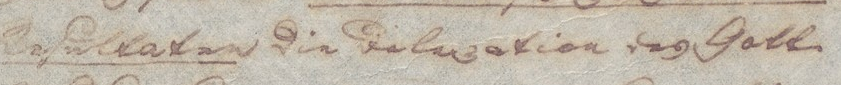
Resultaten die Delegation des Gott-
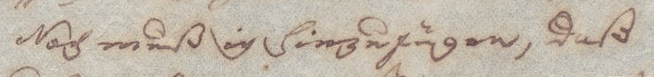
Noch muß ich hinzufügen, daß
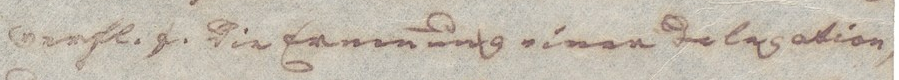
verfl. J. die Ernennung einer Delegation,
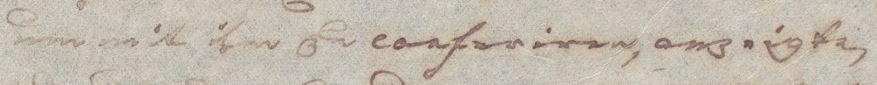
um mit ihm zu conferiren, anzeigte,
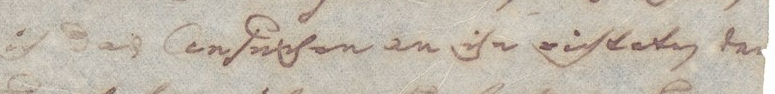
zugleich das Ansuchen an ihn richtete, den
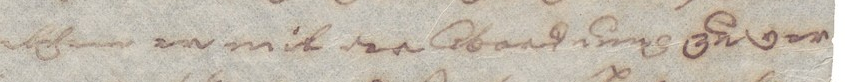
welchem er mit der Abordung zu ver-
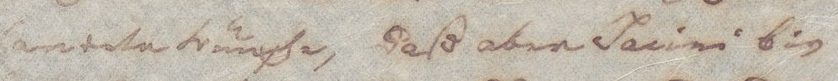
handeln wünsche, daß aber Jacini bis
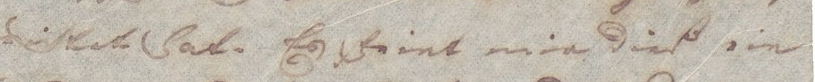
gerichtet hat. Es scheint mir dieß ein
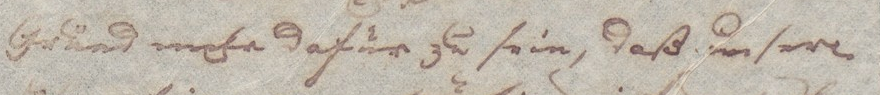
Grund mehr dafür zu sein, daß unsere
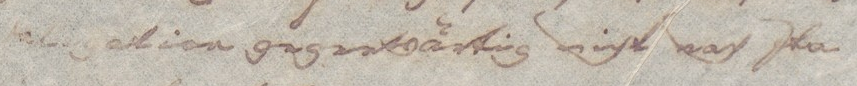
Delegation gegenwärtig nicht nach Ita-
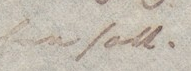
gehen soll.
